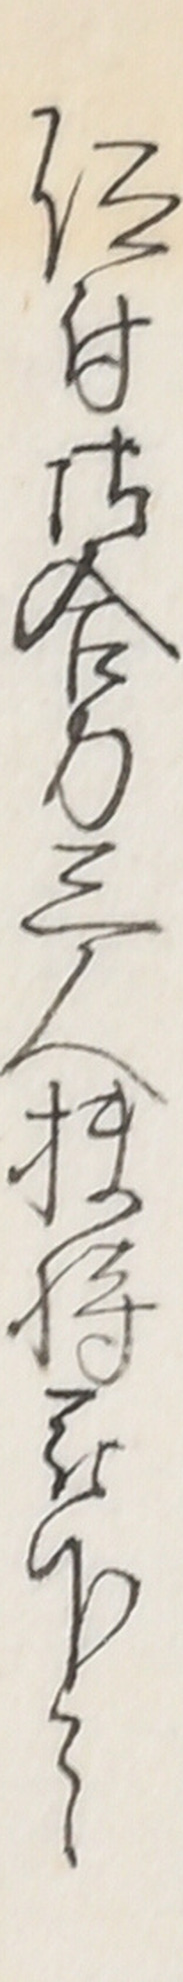仰付御合力三人扶持被下被下之
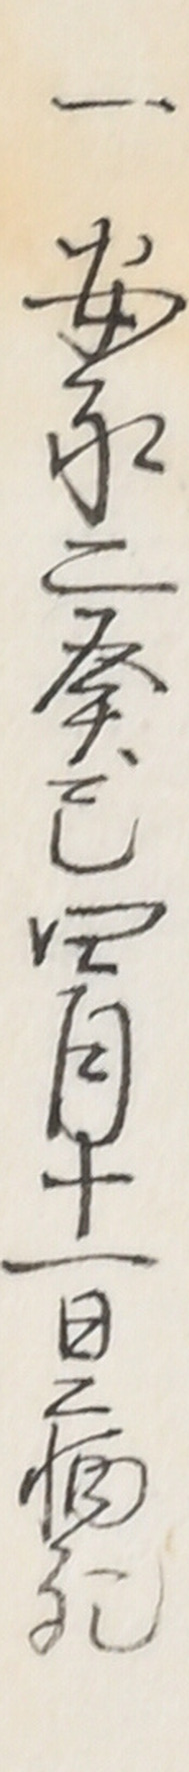一安永二癸巳四月十一日病死
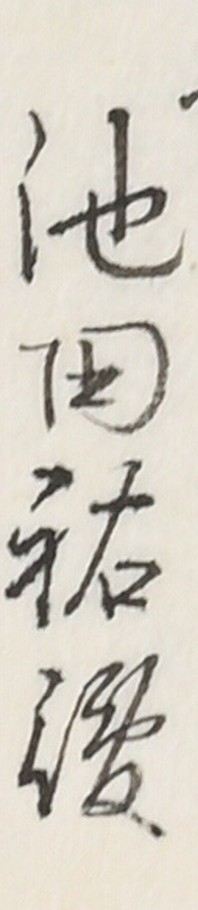池田祐俊
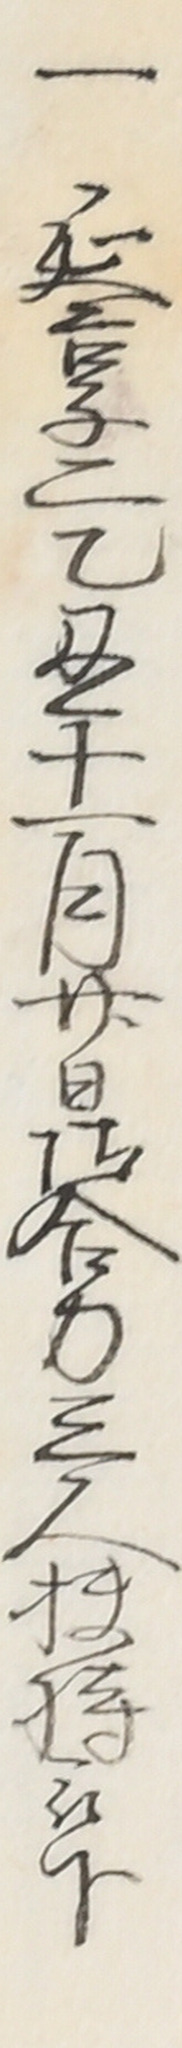一延享二乙丑十一月廿日御合力三人扶持被下
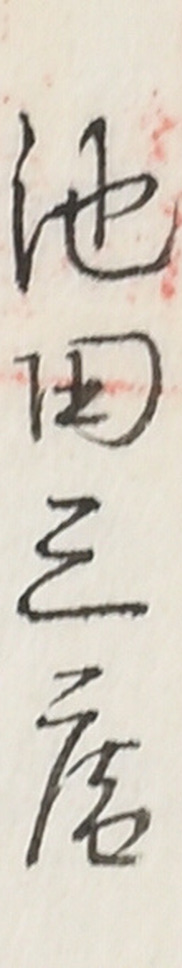池田三庵
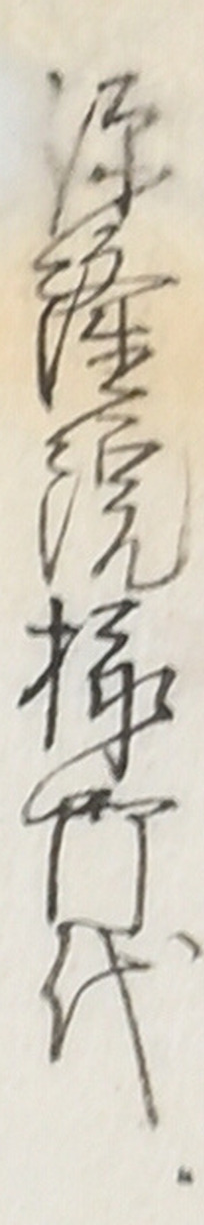源隆院様御代
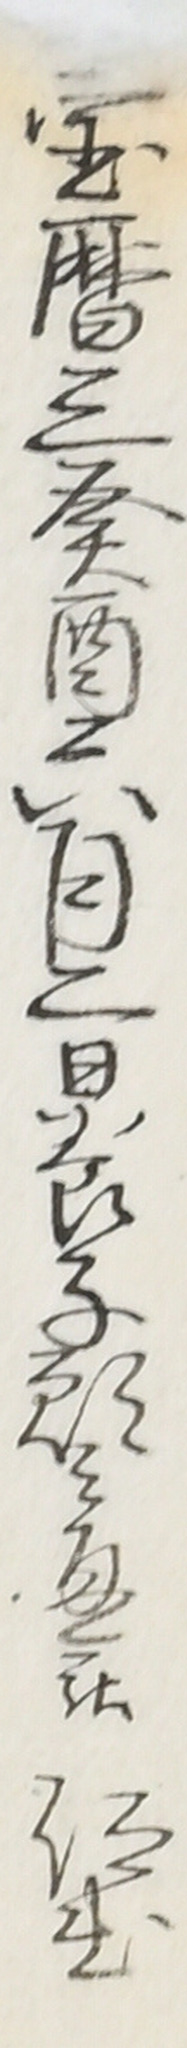宝暦三癸酉六月二日養子願之通被仰出
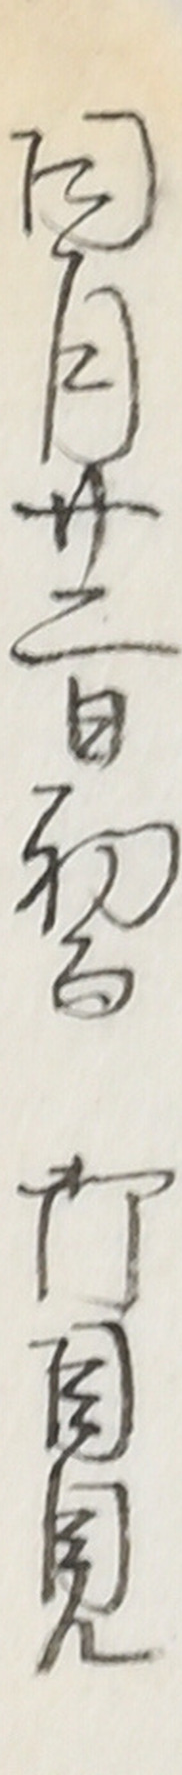一同月廿二日初而御目見
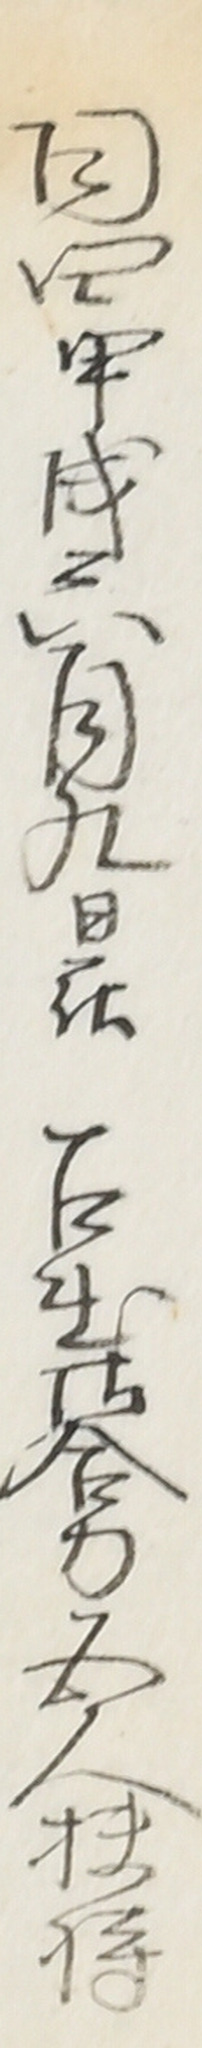一同四甲戌六月九日被召出御合力五人扶持
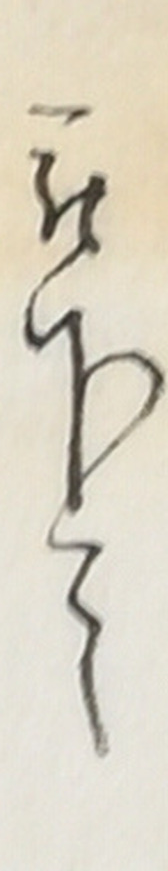被下之
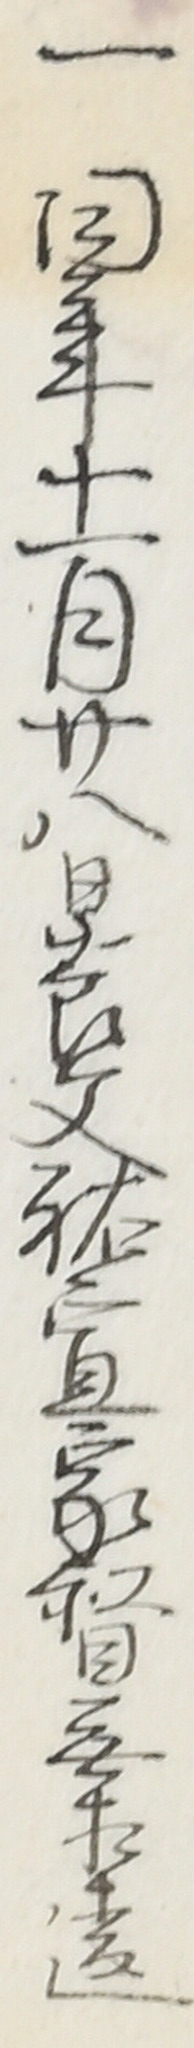一同年十一月廿八日養父祐宣家督無相違
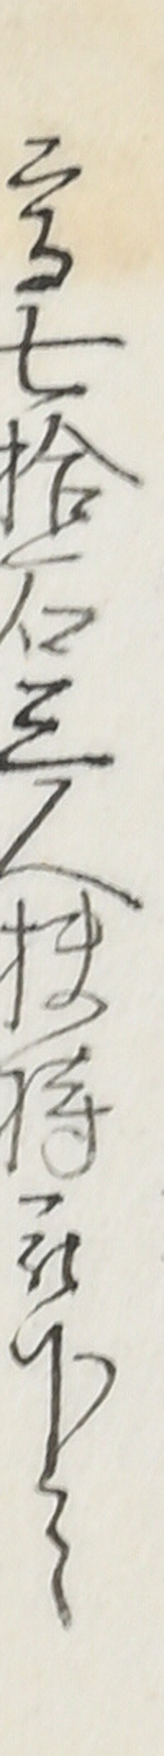高七拾石三人扶持被下之
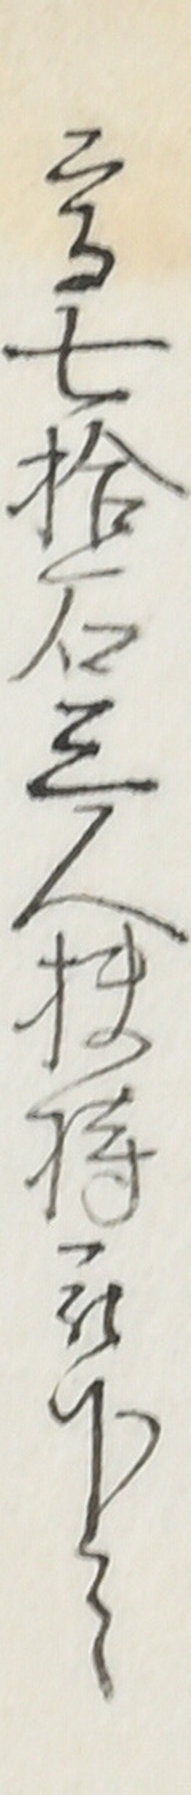高七拾石三人扶持被下之
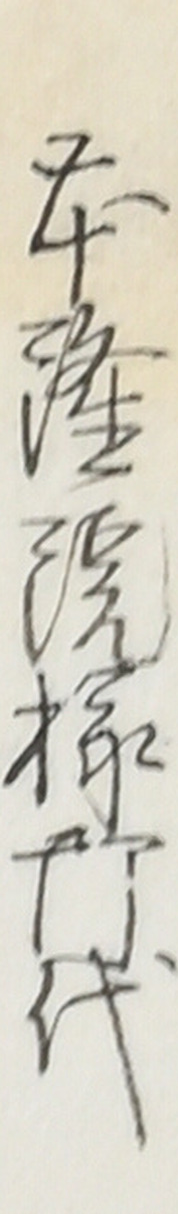本隆院様御代
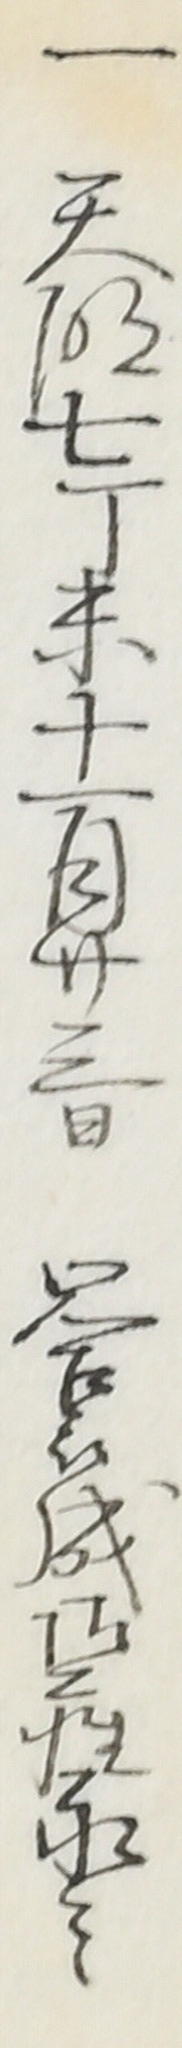一天明七丁未十一月廿三日思召被成御座永之
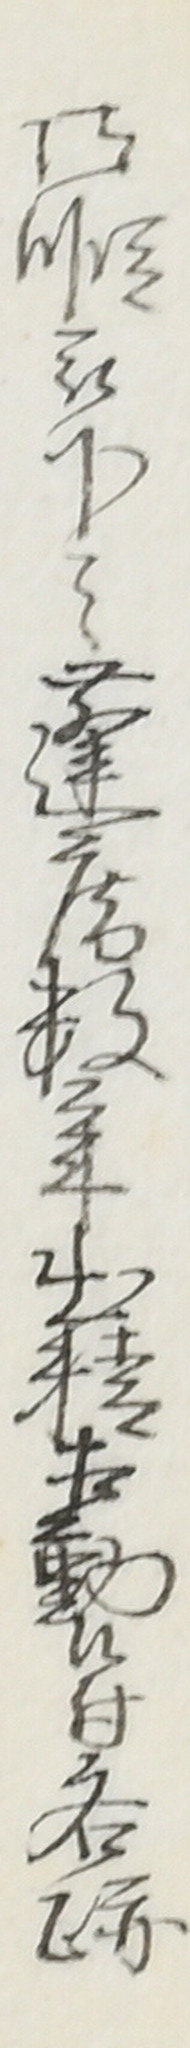御暇被下之蓬庵数年出精相勤候付名跡
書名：給人諸士勤仕録（七）
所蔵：伊那市立高遠町図書館・合同会社AMANE
